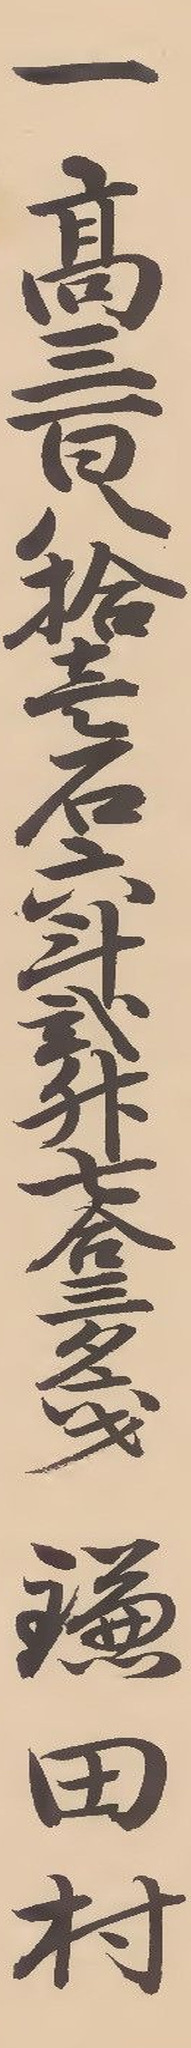一高三百八拾壱石六斗弐升七合三勺六才鎌田村
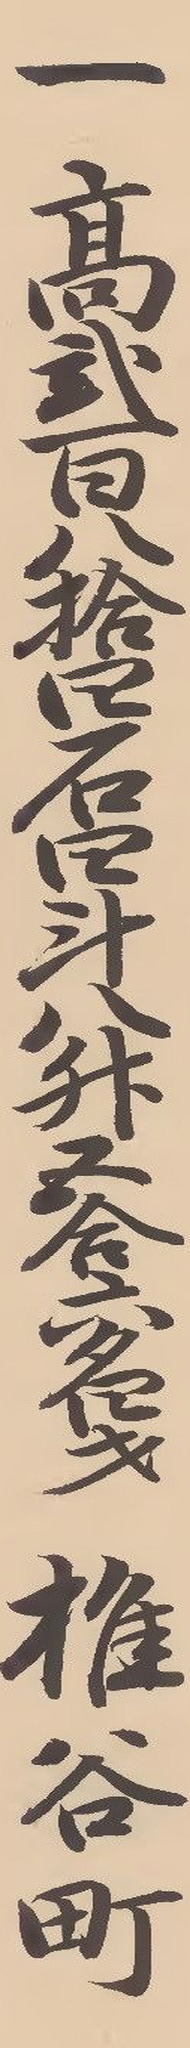一高弐百八拾四石四斗八升五合六勺四才椎谷町
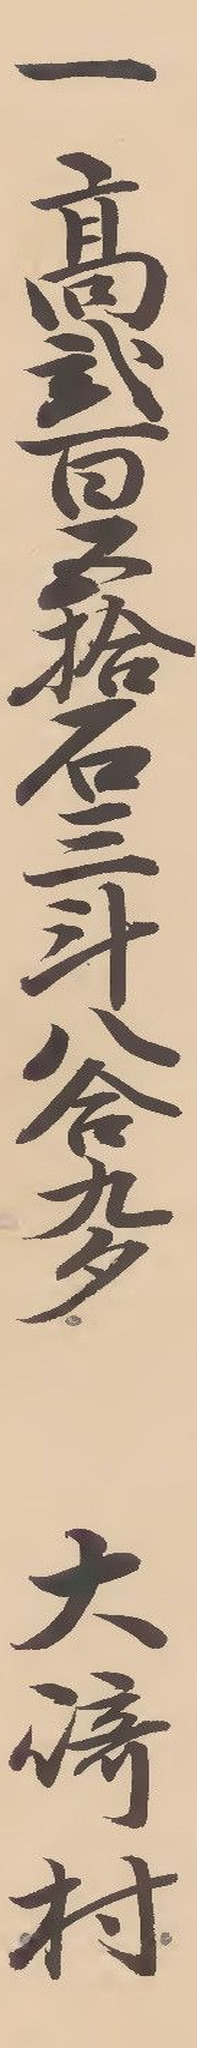一高弐百五拾石三斗八合九勺大崎村

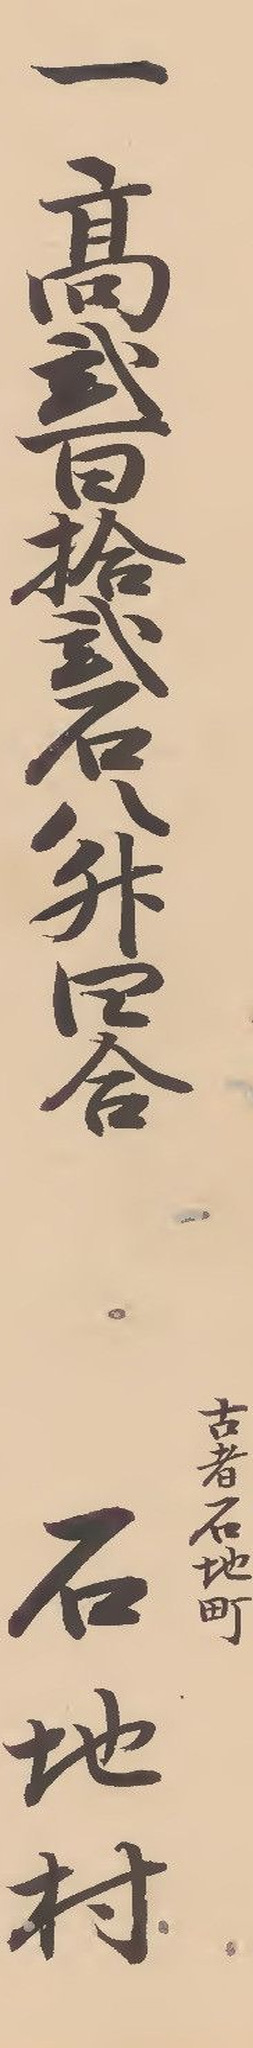一高弐百拾弐石八升四合石地村
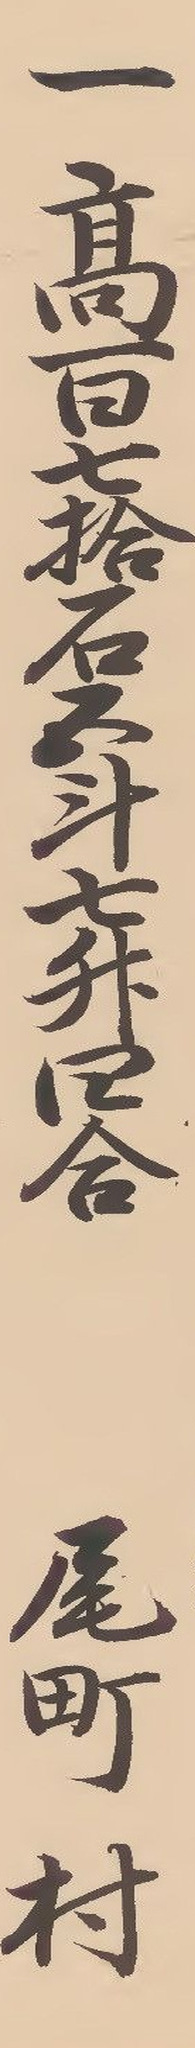一高百七拾石五斗七升四合尾町村
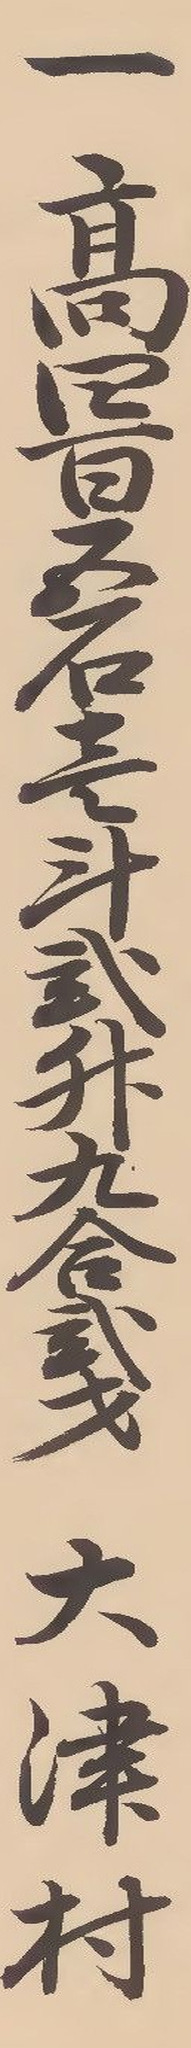一高四百五石壱斗弐升九合弐才大津村
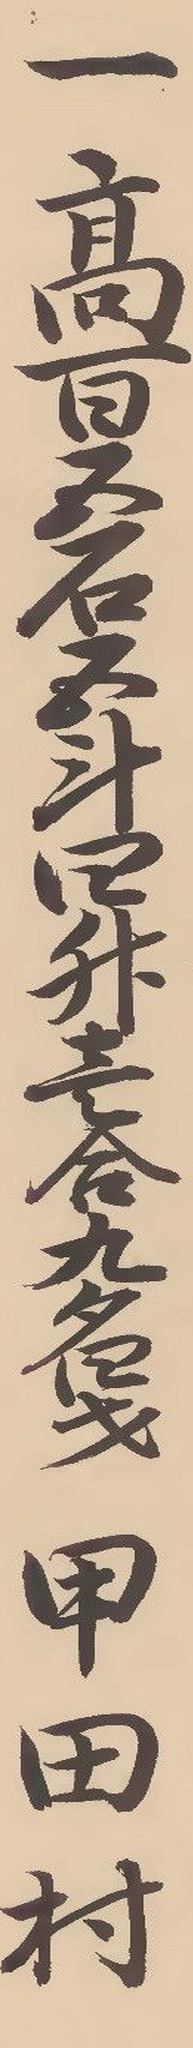一高百五石五斗四升壱合九勺四才甲田村
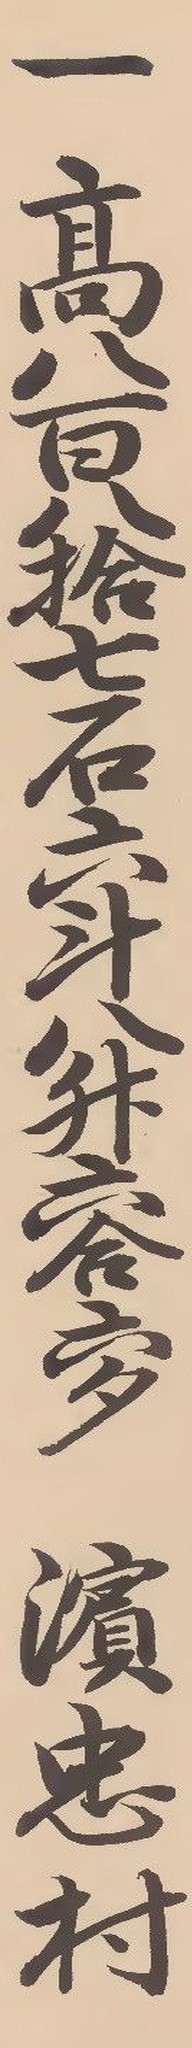一高八百八拾七石六斗八升六合六勺浜忠村
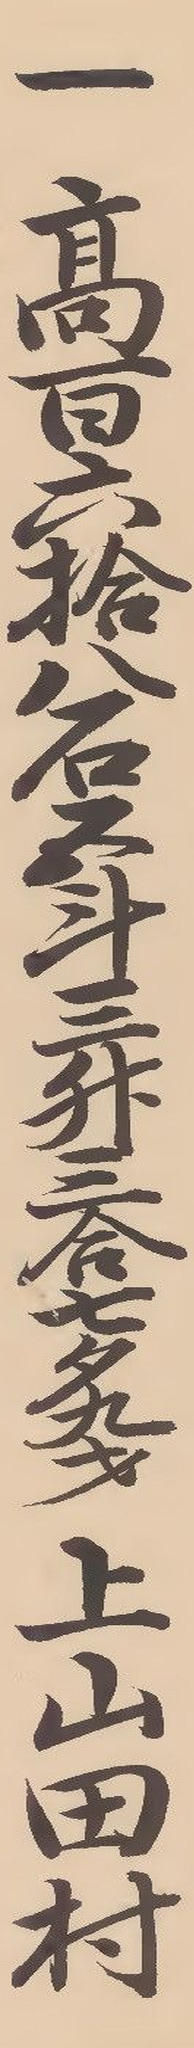一高百六拾八石五斗三升三合七勺九才上山田村
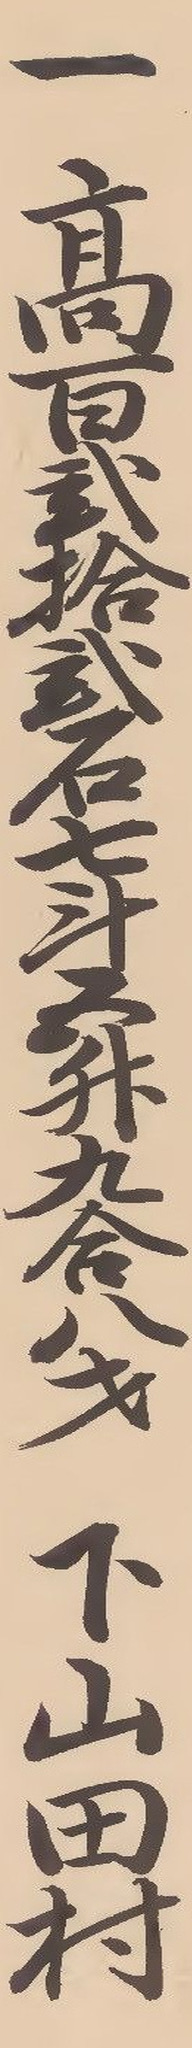一高百弐拾弐石七斗五升九合八才下山田村
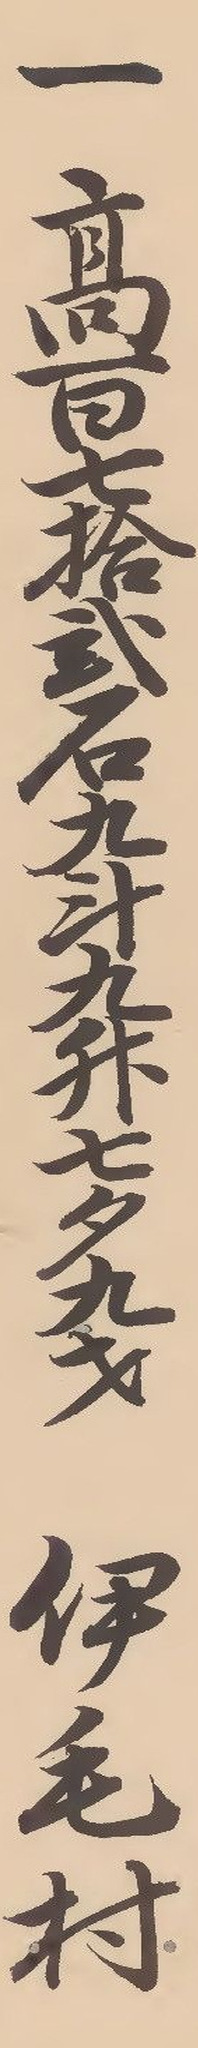一高百七拾弐石九斗九升七勺九才伊毛村

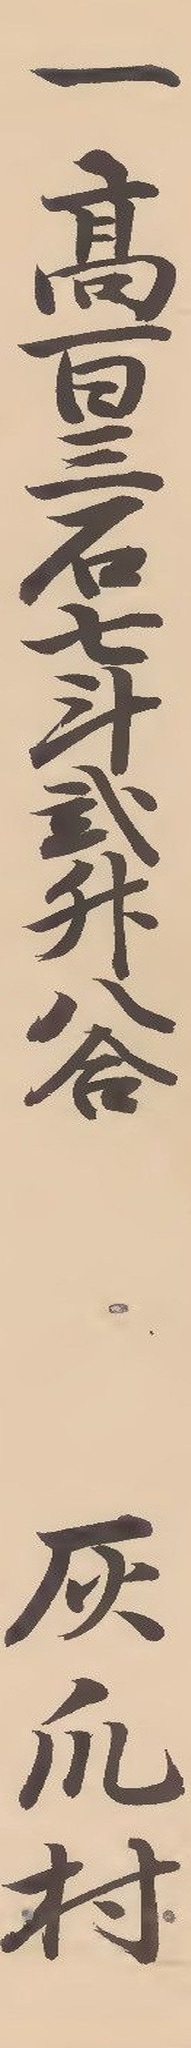一高百三石七斗弐升八合灰爪村
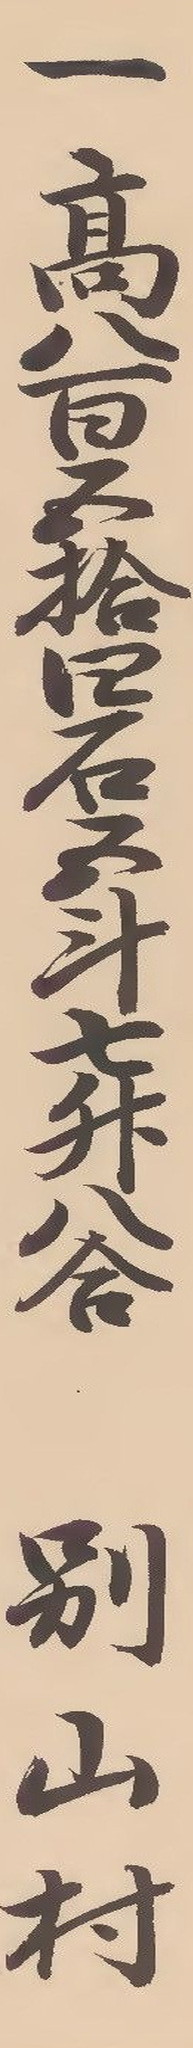一高八百五拾四石五斗七升八合別山村
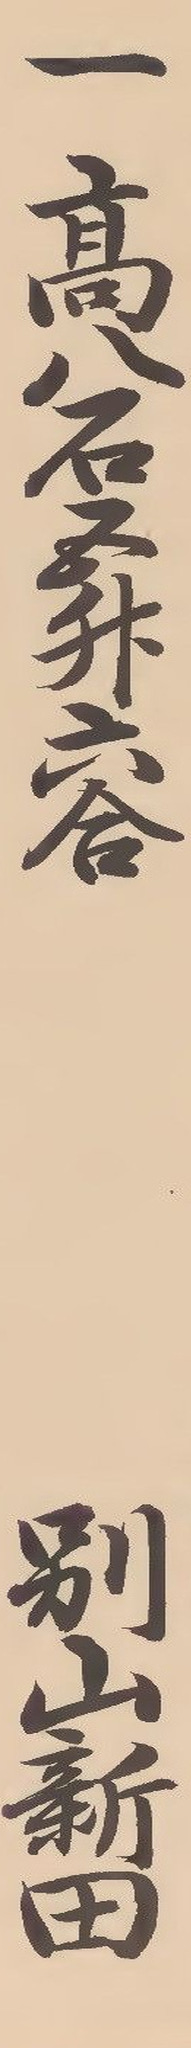一高八石五升六合別山新田
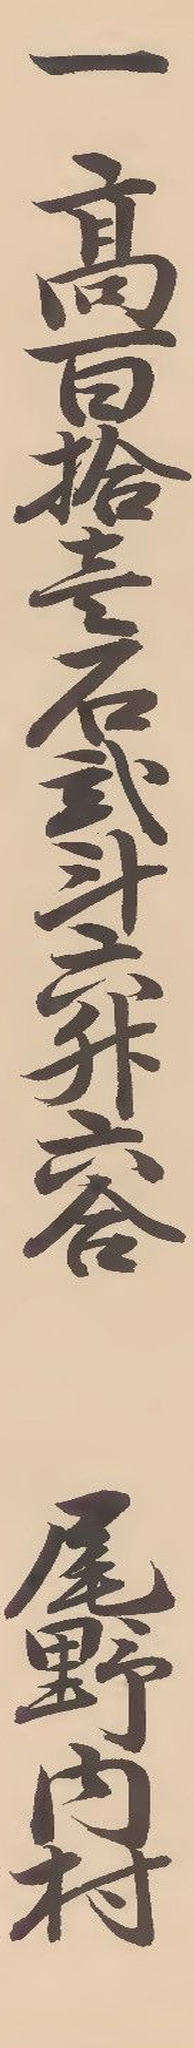一高百拾壱石弐斗六升六合尾野内村
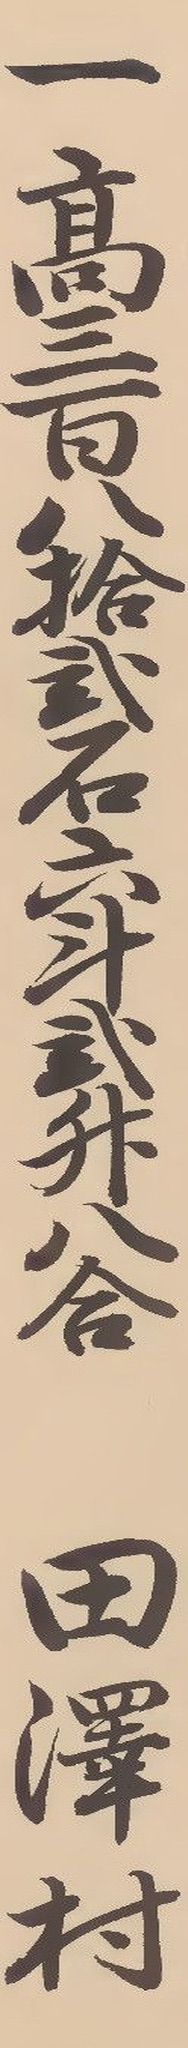一高三百八拾弐石六斗弐升八合田沢村
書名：越後国郷帳　中
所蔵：国立公文書館 National Archives of Japan
